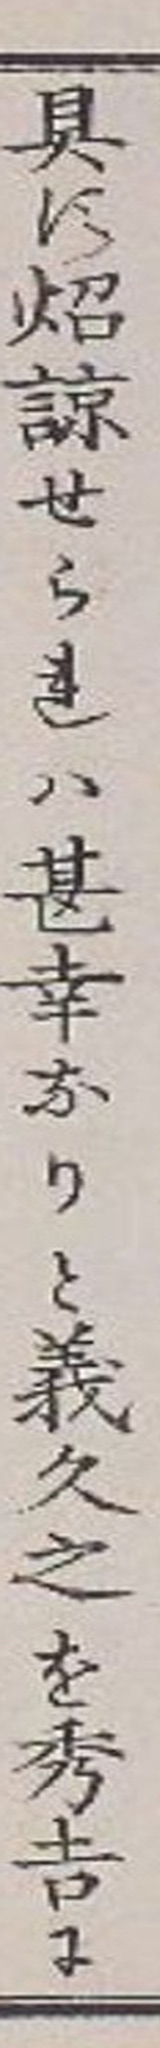具す炤諒せられは甚幸なりと義久之を秀吉に
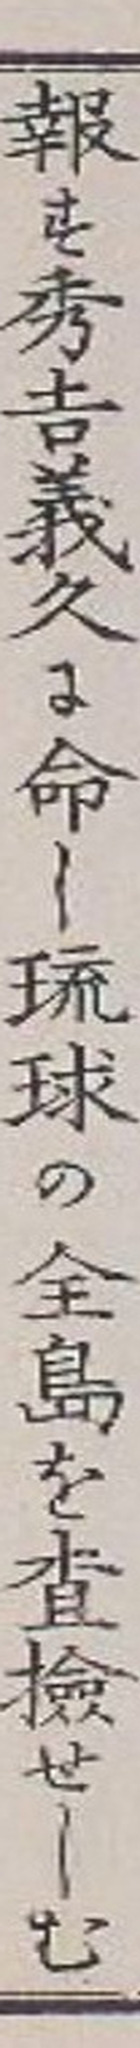報す秀吉義久に命し琉球の全島を査検せしむ
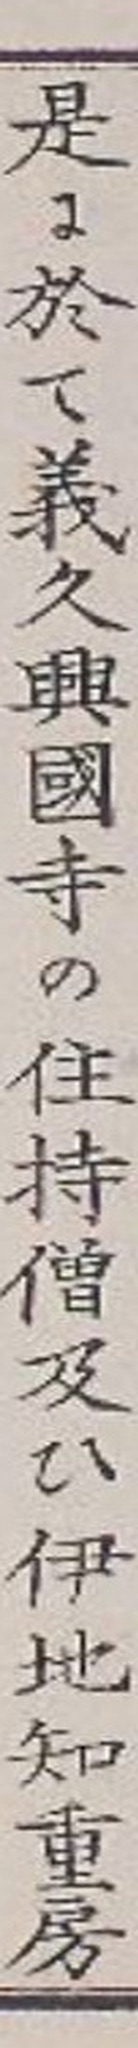是に於て義久興国寺の住持僧及ひ伊地知重房
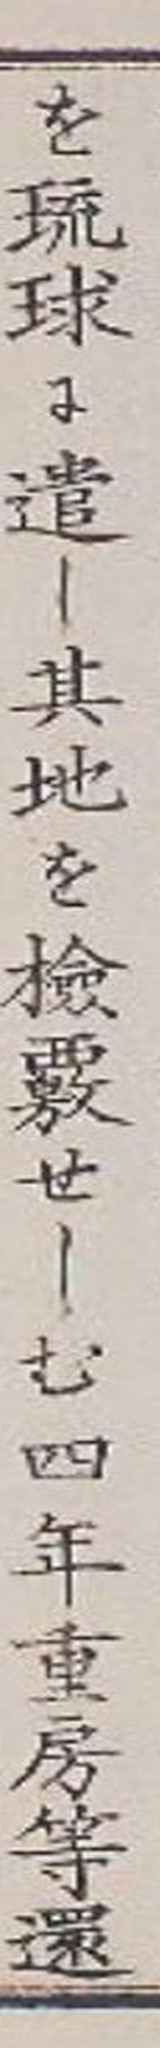を琉球に遣し其地を検覈せしむ四年重房等還
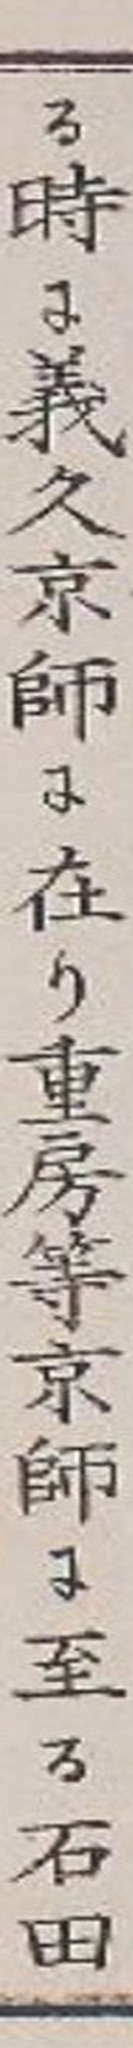る時に義久京師に在り重房等京師に至る石田
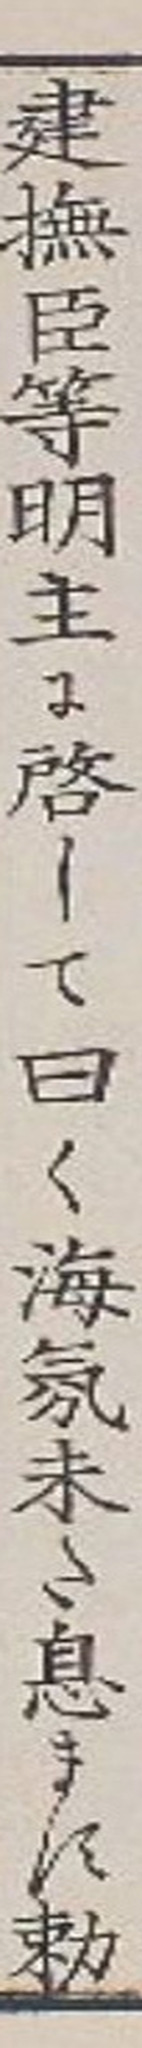建撫臣等明主に啓して曰く海気未た息ます勅
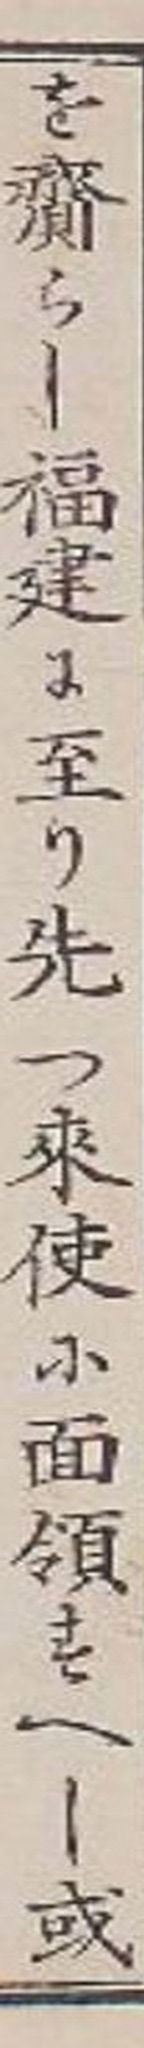を齎らし福建に至り先つ来使に面領すへし或
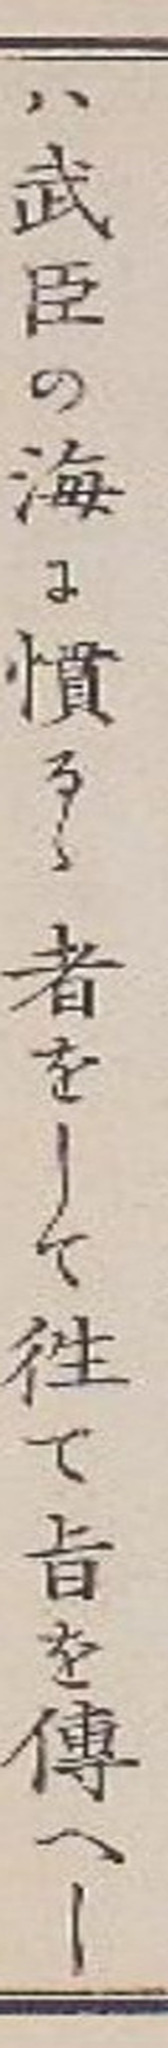は武臣の海に慣るゝ者をして往て旨を伝へし
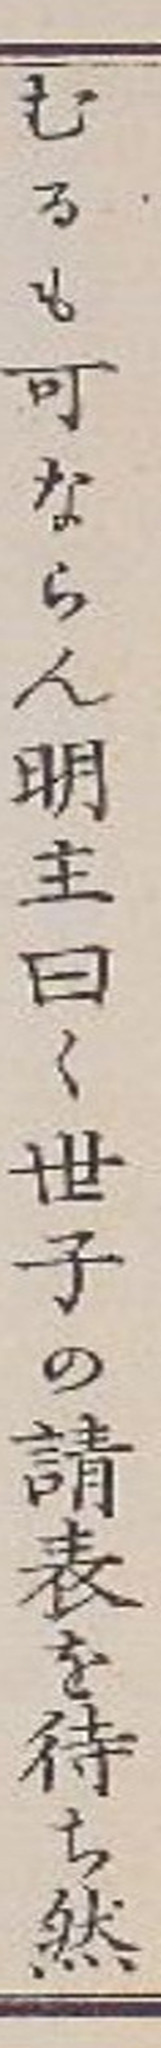むるも可ならん明主曰く世子の請表を待ち然
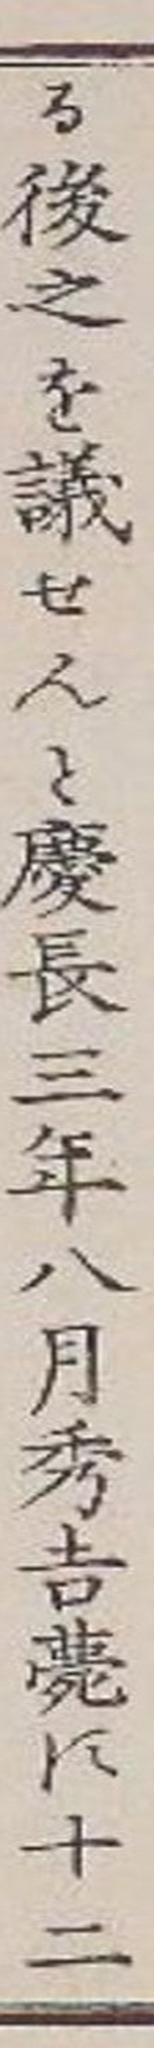る後之を議せんと慶長三年八月秀吉薨す十二
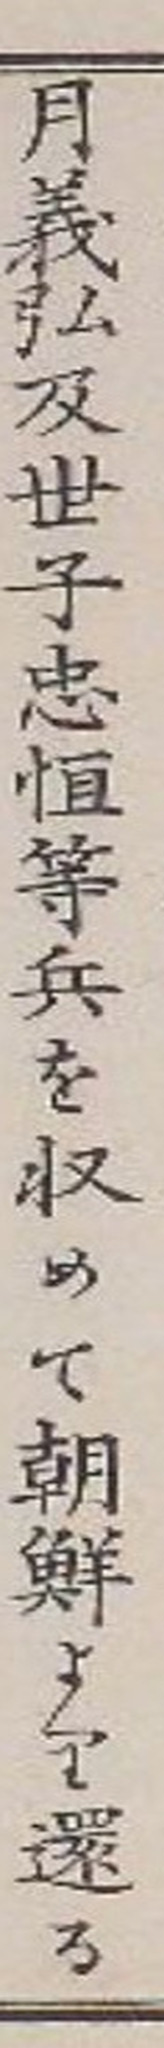月義久及世子忠恒等兵を収めて朝鮮より還る
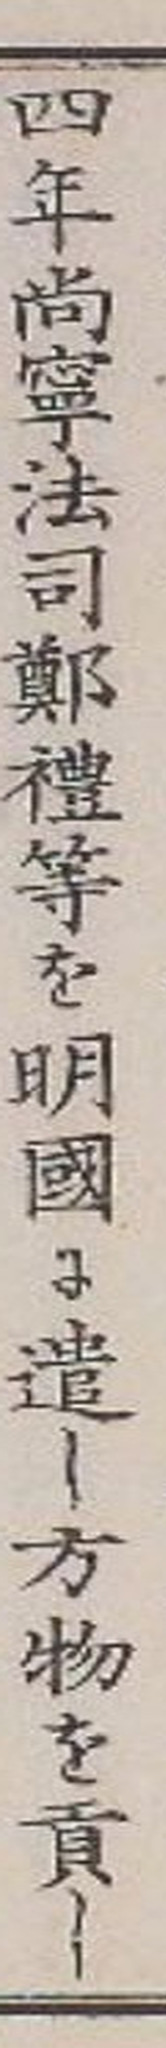四年尚寧法司鄭礼等を明国に遣し方物を貢し
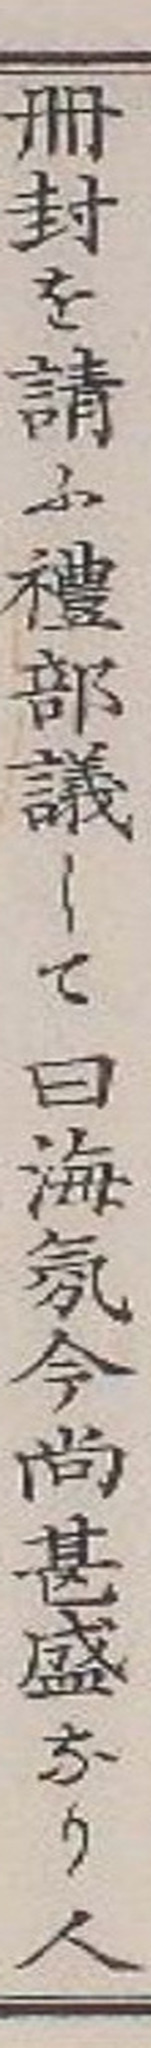冊封を請ふ礼部議して曰海気今尚甚盛なり人
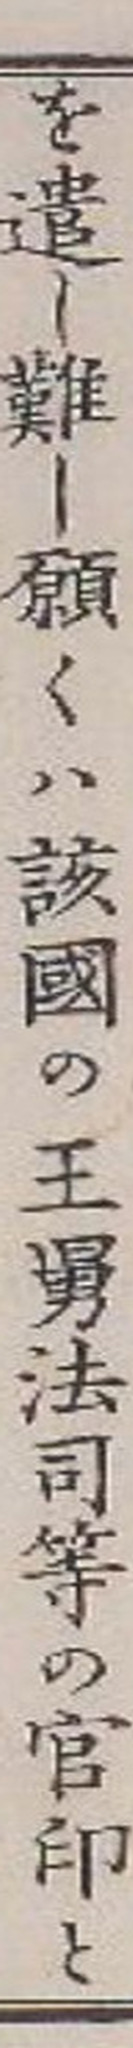を遣し難く願くは該国の王舅法司等の官印と
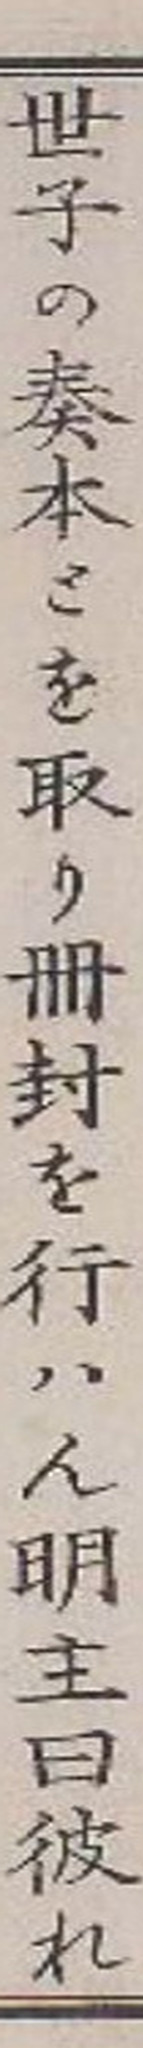世子の奏本とを取り冊封を行はん明主曰彼れ
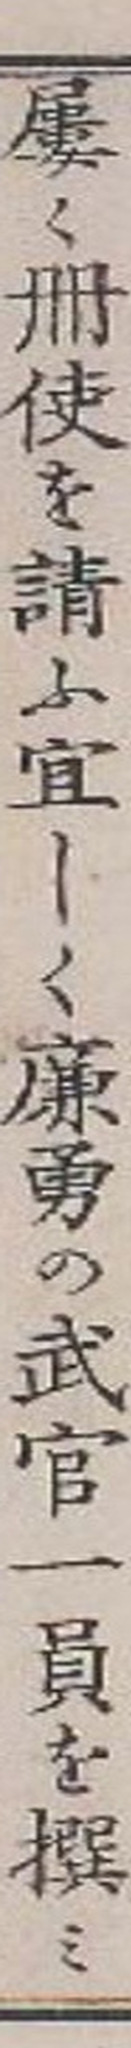屡々冊封を請ふ宜しく廉勇の武官一員を撰み
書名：南島紀事 中
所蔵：University of the Ryukyus Library
